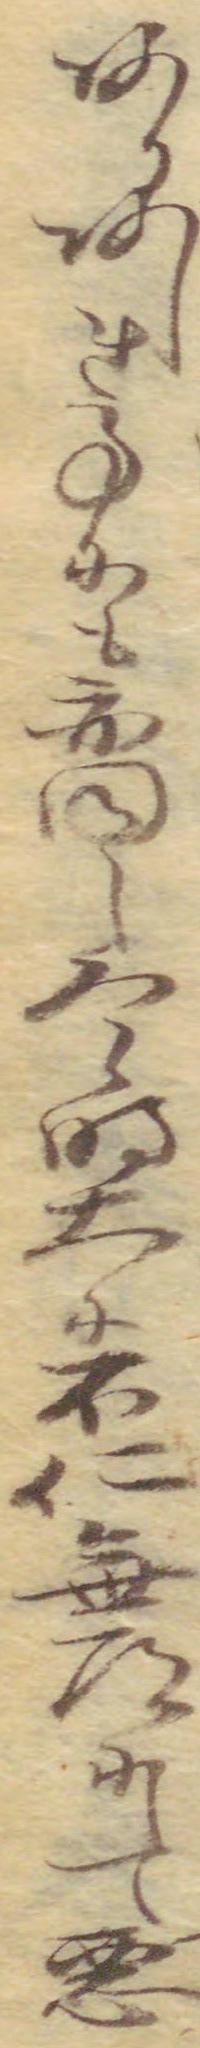ありあしき事にも亦同し今時大に不仁無道にして悪

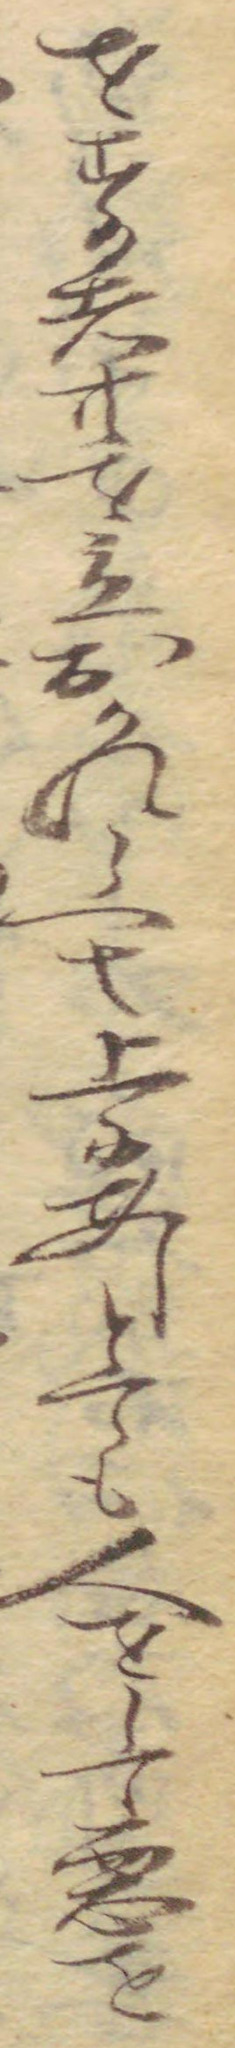をする者共を立おかれ候へは上になしとても人をして悪を
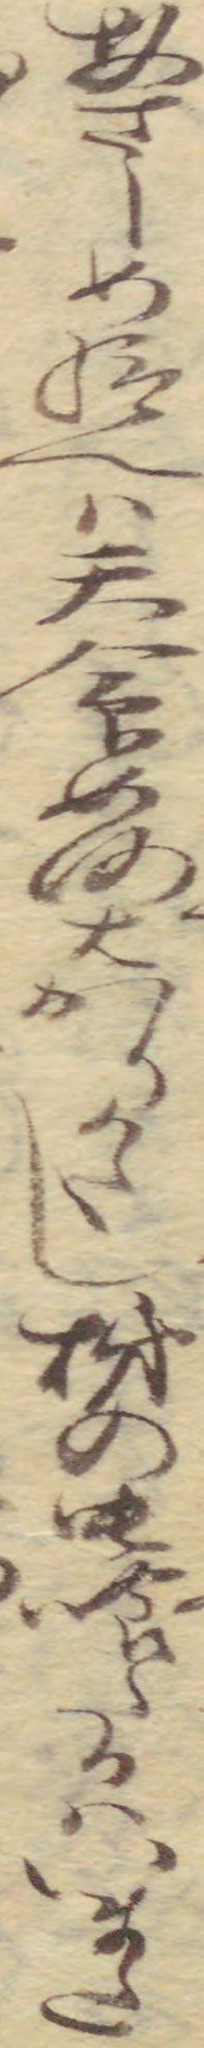なさしめ給へは天命如何はかりかたし柿の虫喰たるはいまた
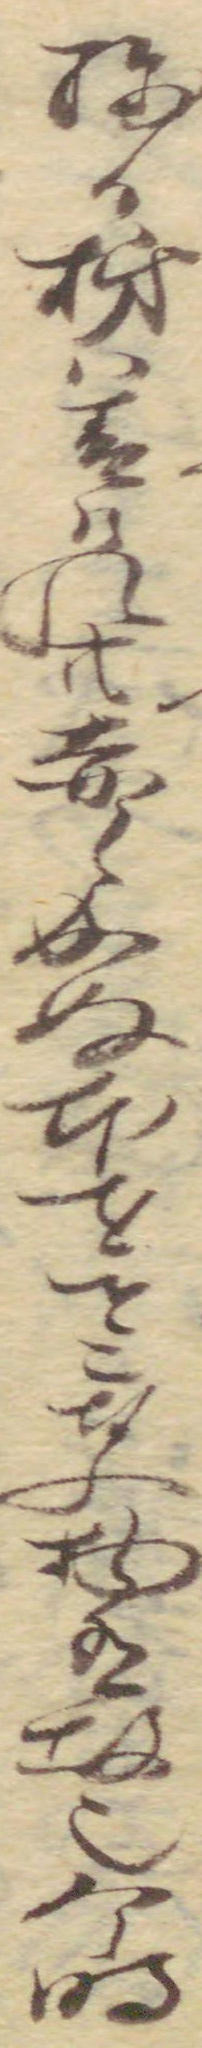残る柿は青けれ共赤く成ぬ本をそこなふ物有故也今時
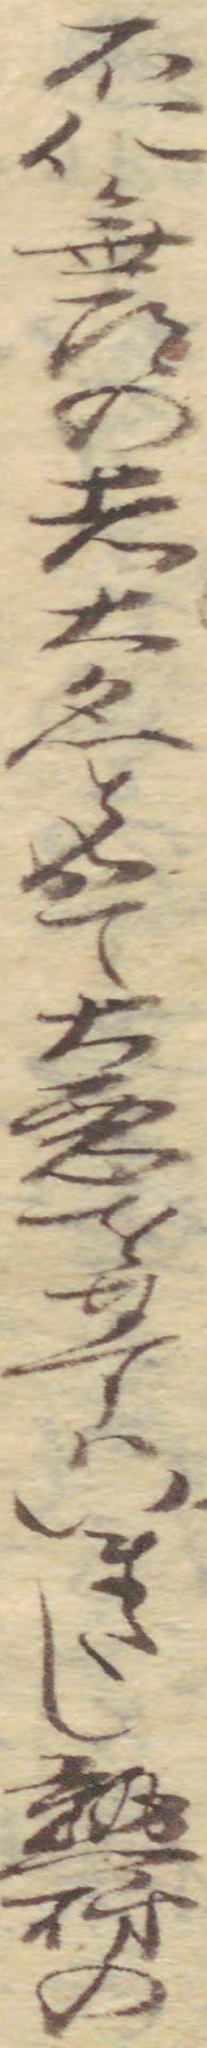不仁無道の者大名と成て大悪をなすはいまたし熟柿の
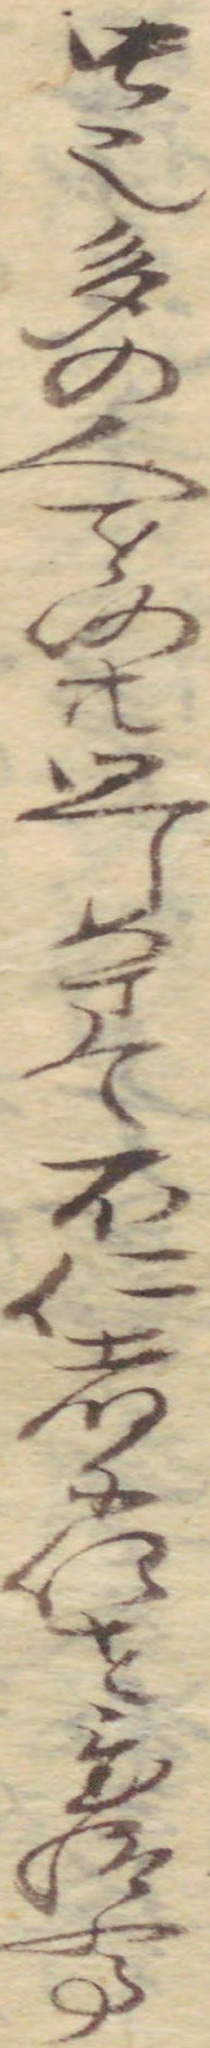虫也多の人を何共思しめさて不仁者に任せ置給ふ事
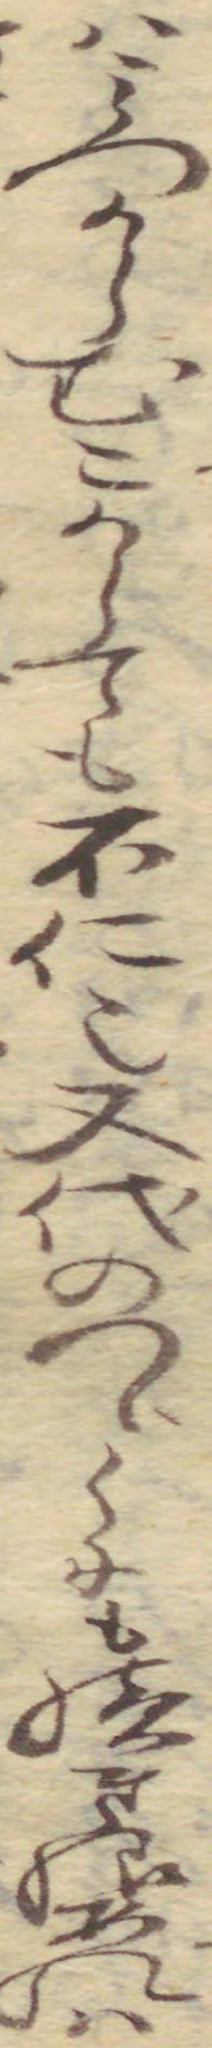はみつからむこからても不仁也又代のつゝくにも続き様あれは
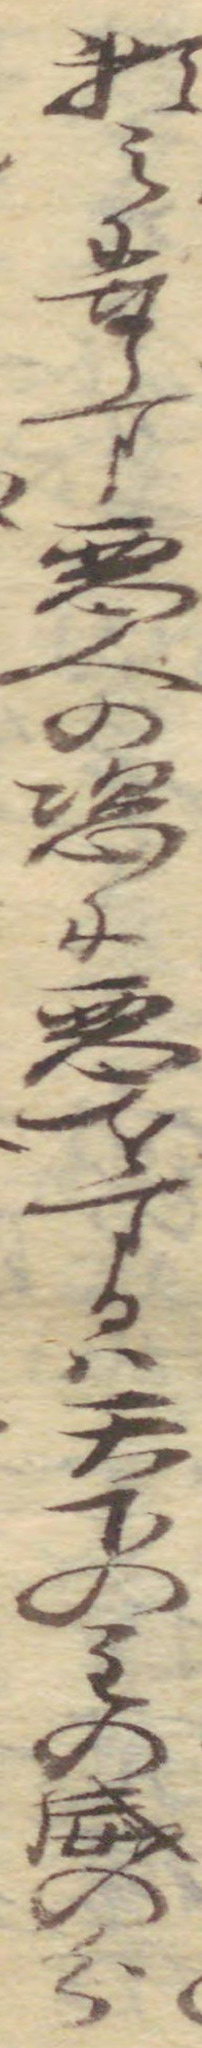頼みにならす悪人の恣に悪をするは天下の主の威の分
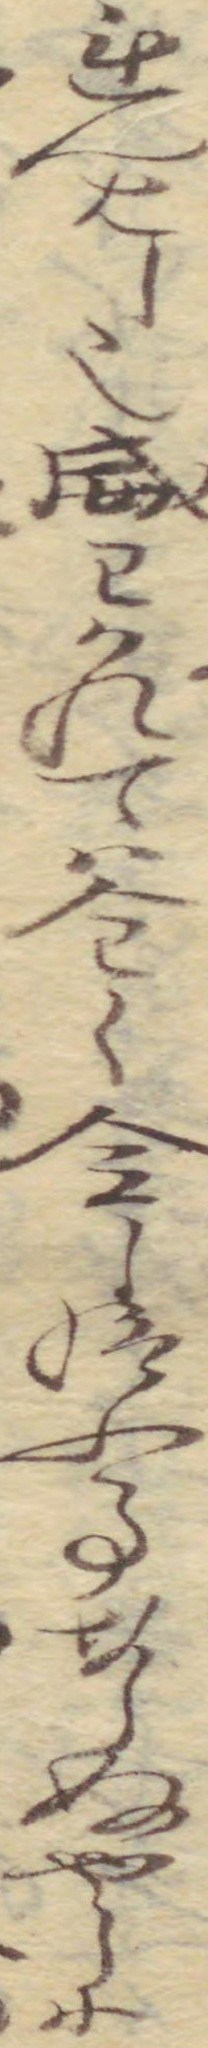れんはし也威わかれては全く令し給ふ事ならぬやうに
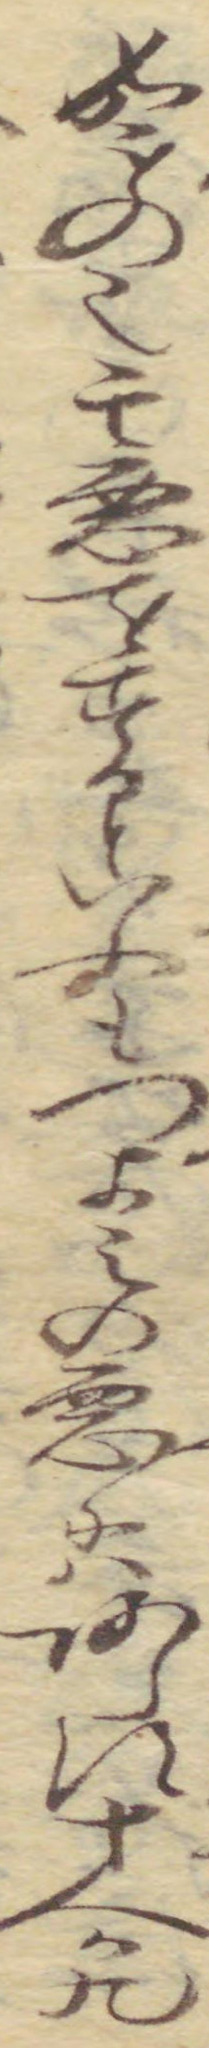成もの也其悪をするといふもつよみの悪にはあらす十人か九
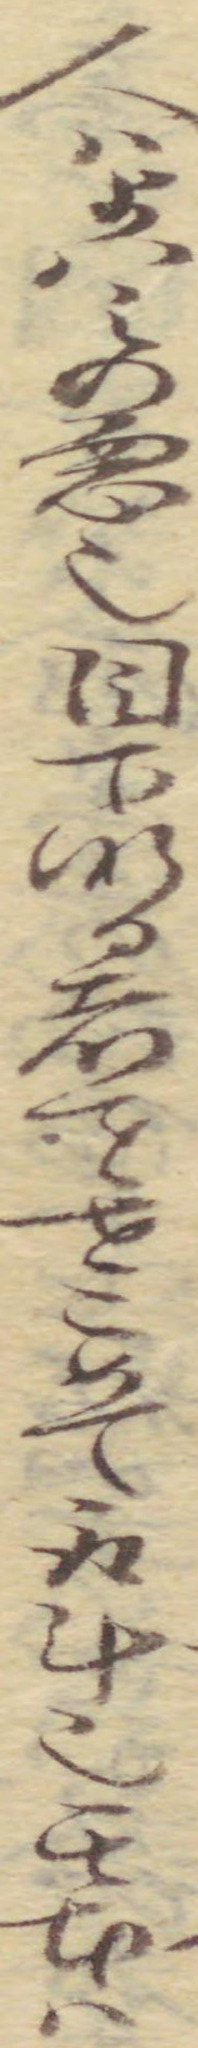人はよはみの悪也目下なる者をせこめて取計也其本は
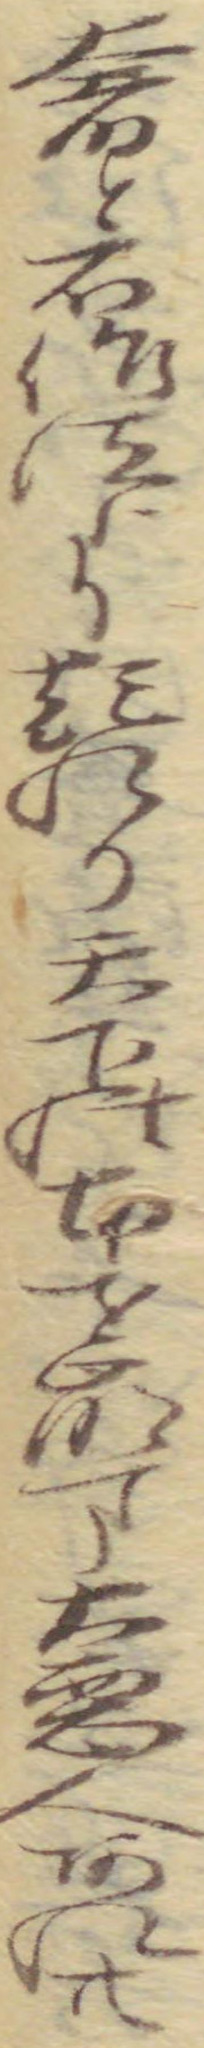奢と不作法より起れり天下の本を崩す大悪人あれ共
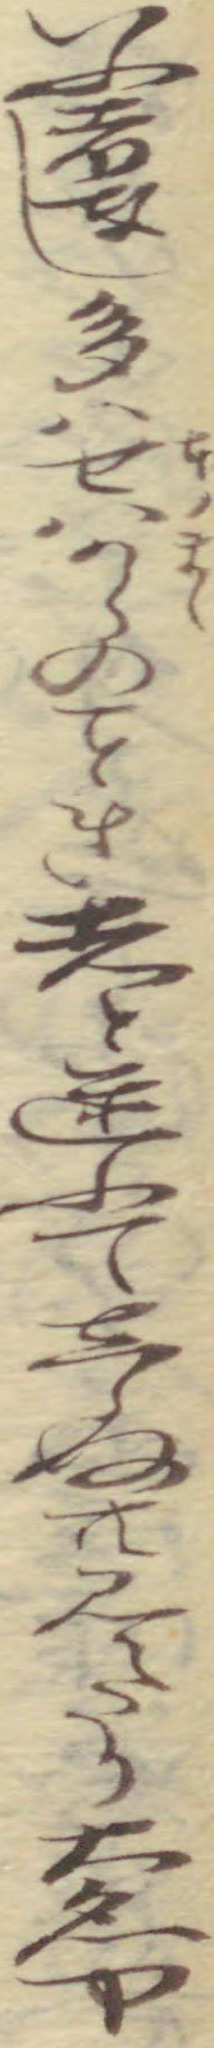いふ者なし多は世はかくのことき者と迷ふてしらぬ共見えたり大名中
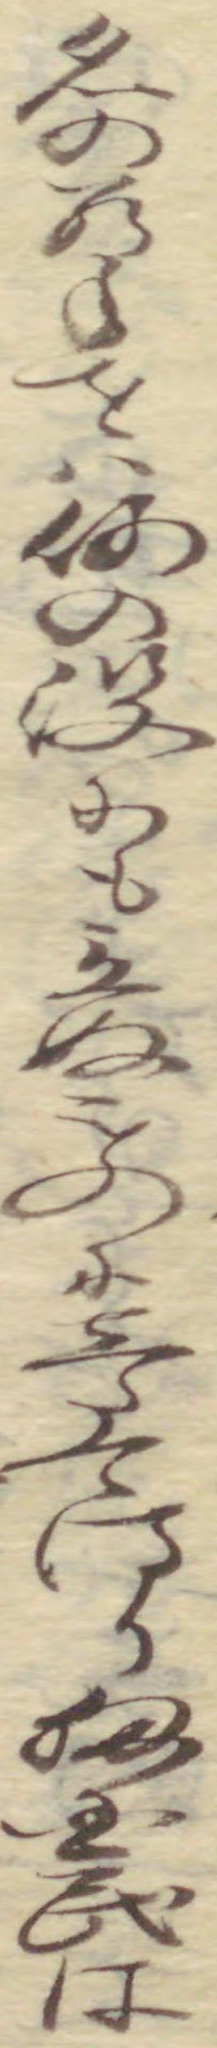名の若手をは何の役にも立ぬものにしたて侍り扨国民は
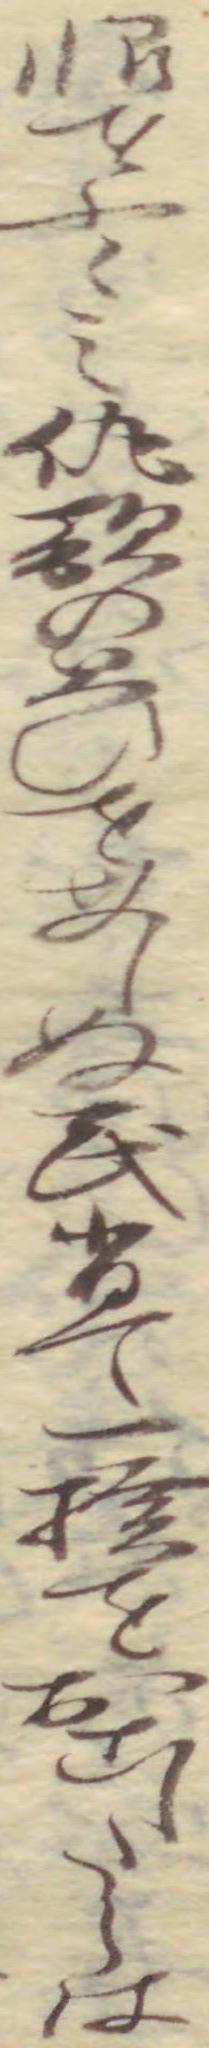恨をふくみ仇敵の思ひをなしぬ民背て一揆をおこしたらは
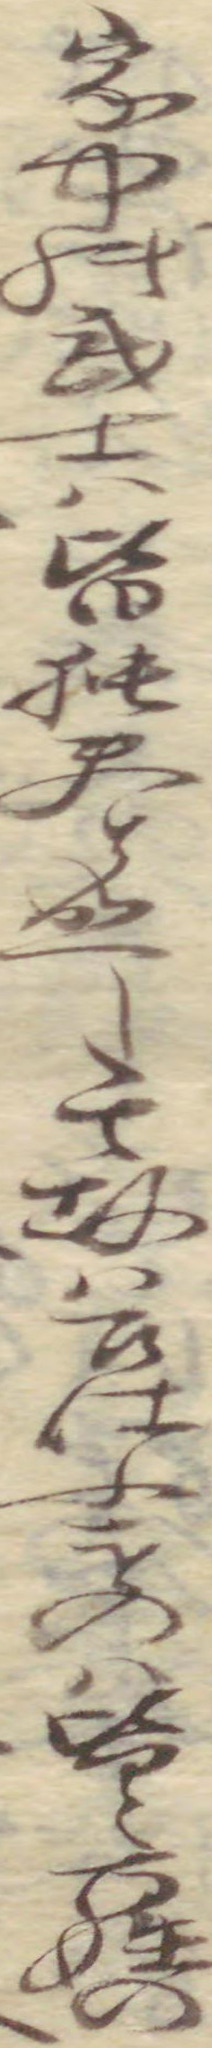家中の武士は皆独夫と成へし其故は召仕ふものは皆〻百姓の
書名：鶯宿雑記. 巻263-264
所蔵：国立国会図書館 National Diet Library, JAPAN
